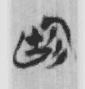廷
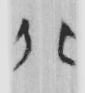北
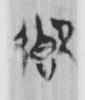鄉
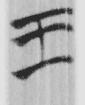王
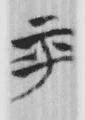乎
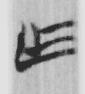乍
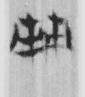冊
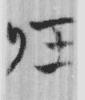任
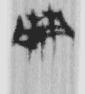冊
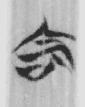命
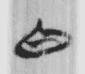白
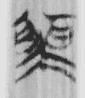{聑大}
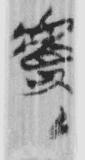{虍且又}
